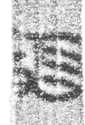○（聞）
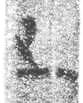之
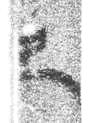也
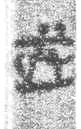武
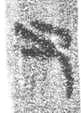又（有）
